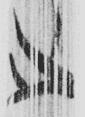之
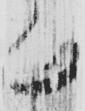㠯（以）
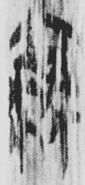衰
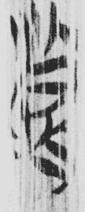○（汲）
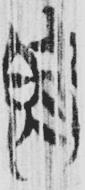既
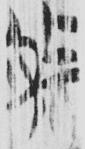祭
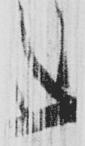之
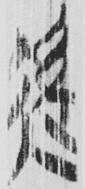後
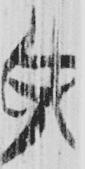𡚦（焉）
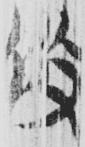攸（修）
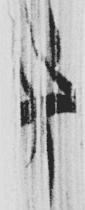先
